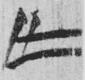亡（無）
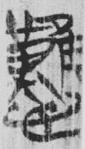○（難）
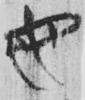母（毋）
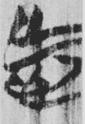忘
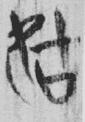姑
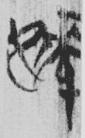○（姊）
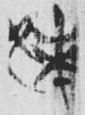妹
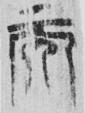而
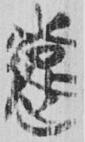遠
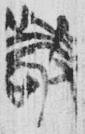敬
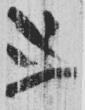之
